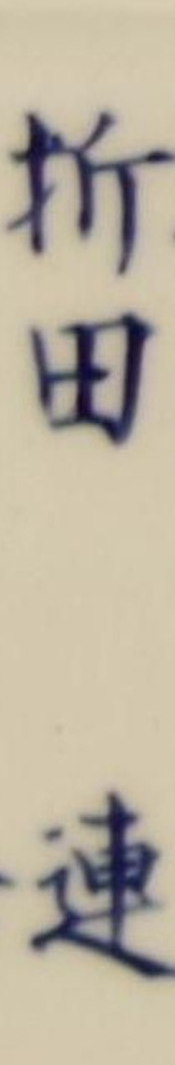折田連
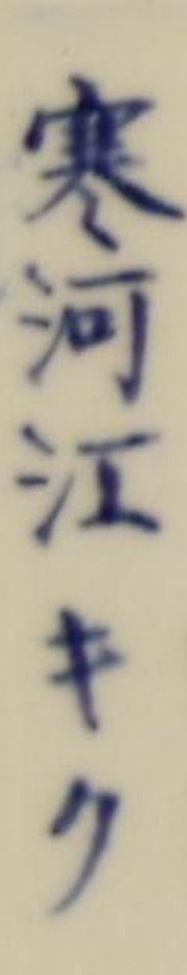寒河江キク

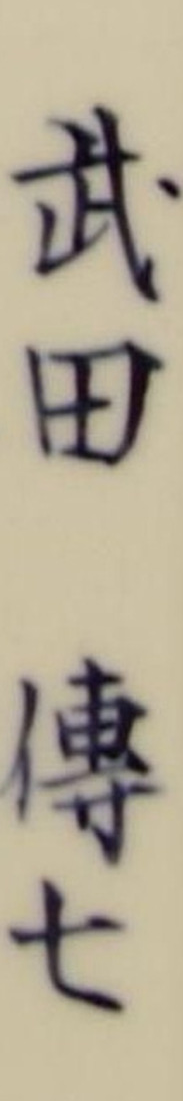武田傳七
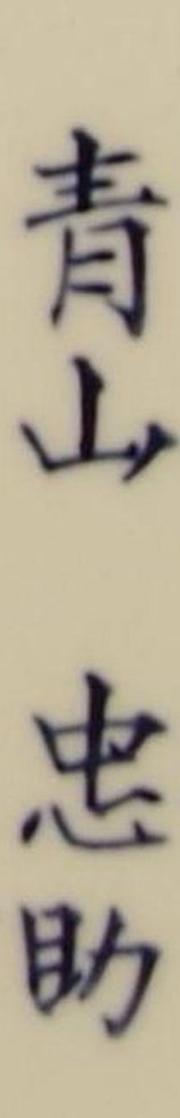青山忠助
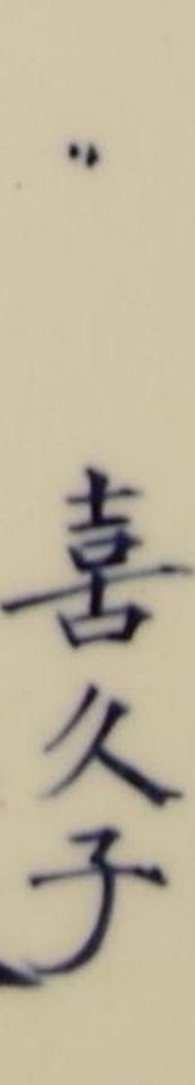喜久子
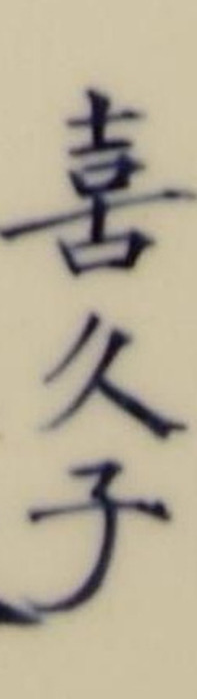喜久子
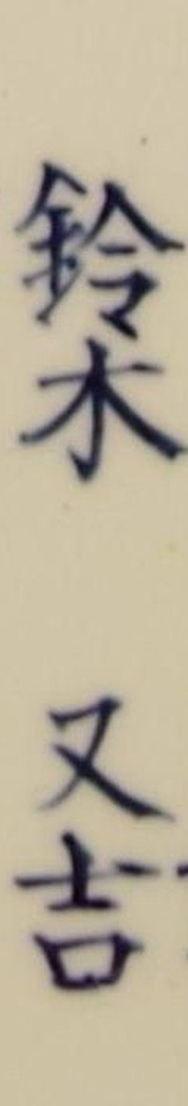鈴木又吉
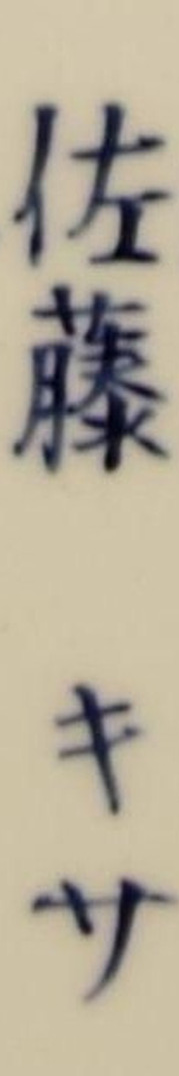佐藤キサ
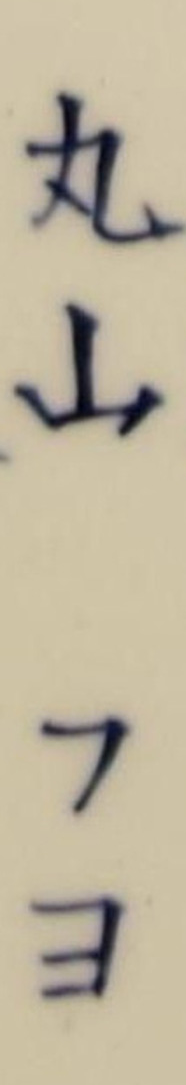丸山フヨ
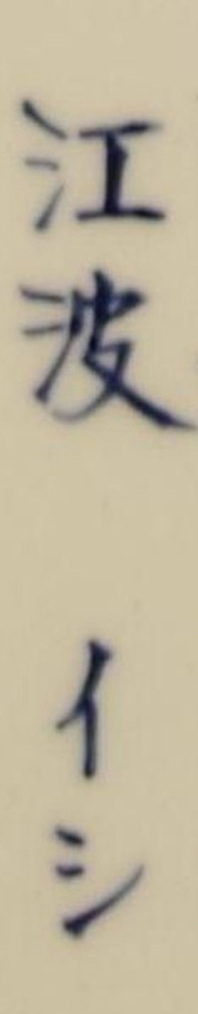江波イシ
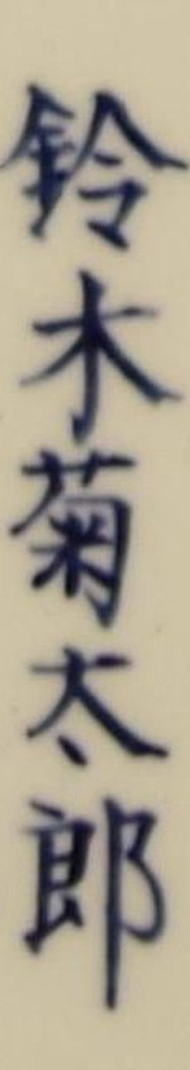鈴木菊太郎
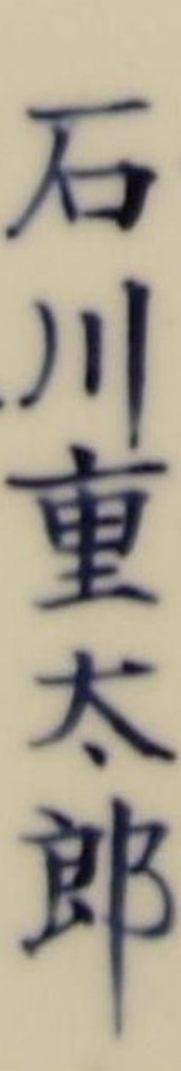石川重太郎
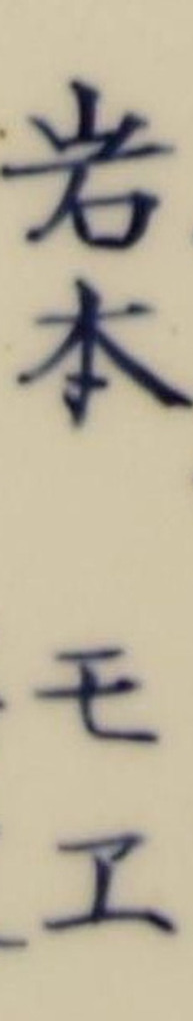岩本モヱ
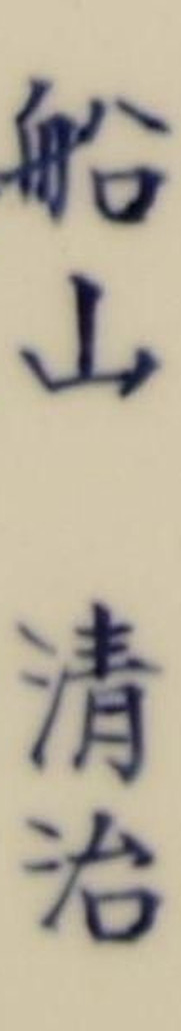船山清治
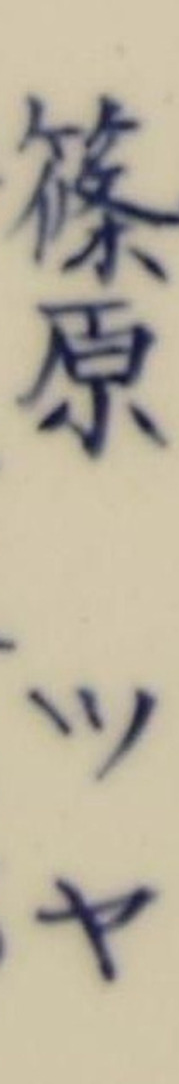篠原ツヤ
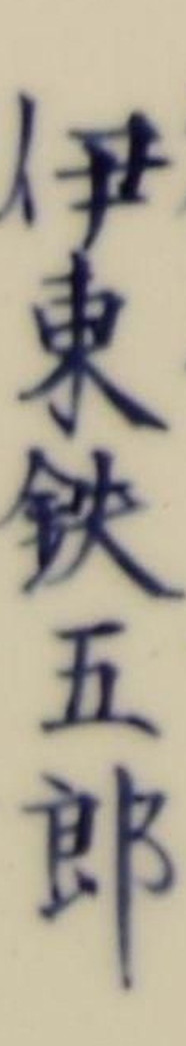伊東鉄五郎
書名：A~D
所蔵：koyasan kongobuji
